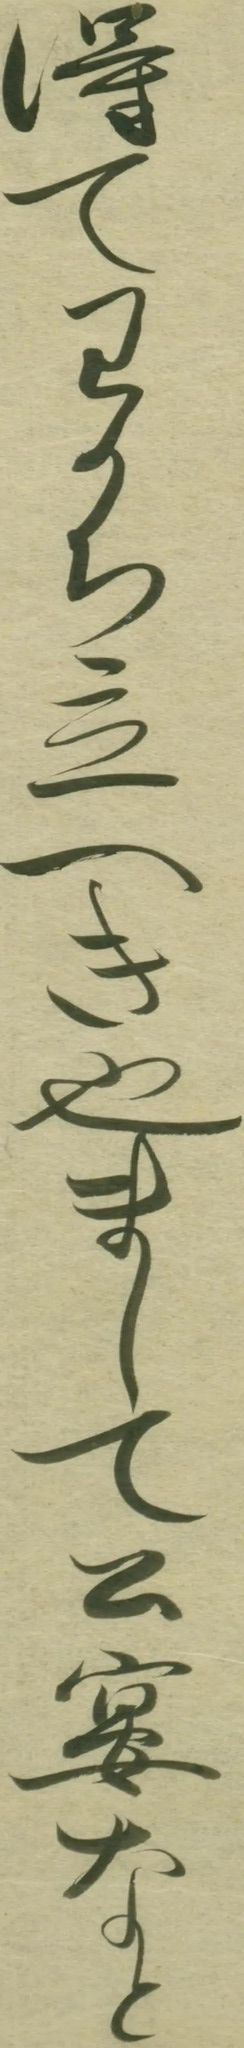得てわかち立へき也まして公宴なと
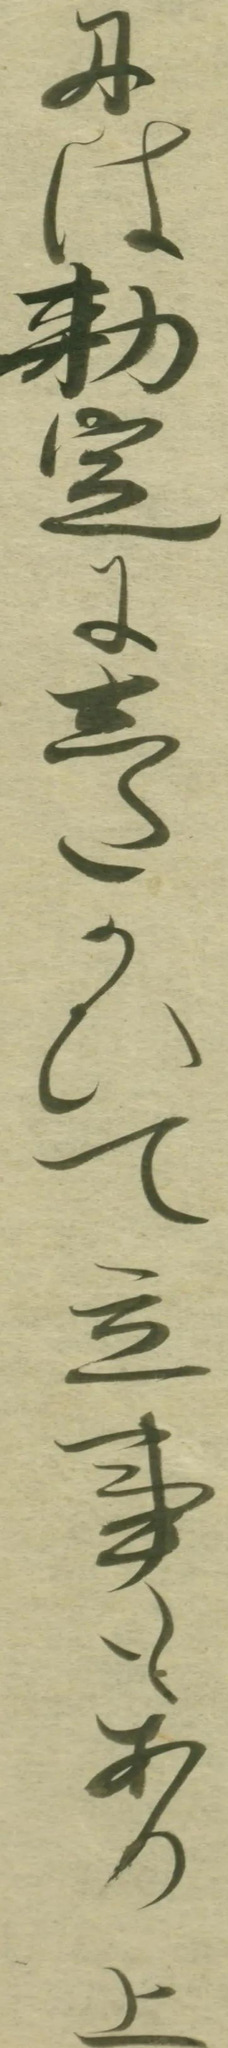には勅定にしたかひて立事もあり上
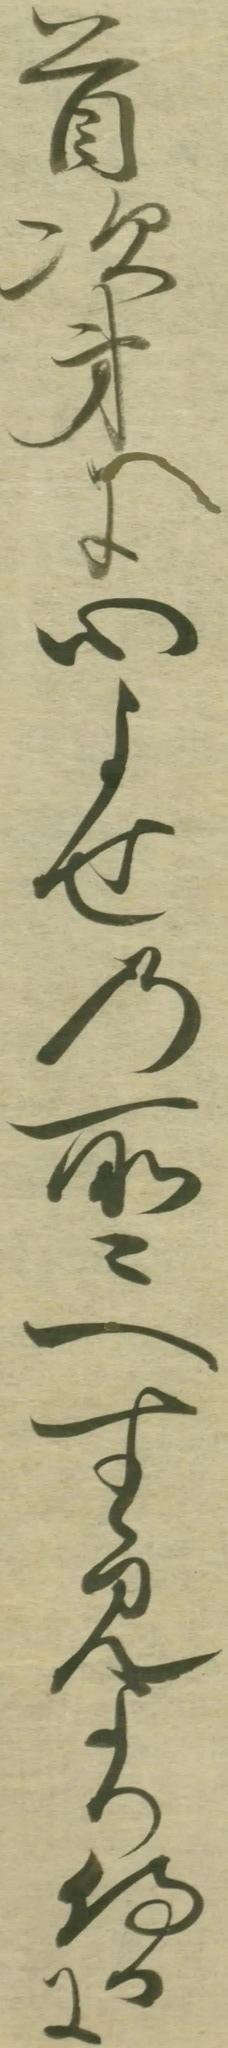首次第に心よせの所々へすゝみより侍るに
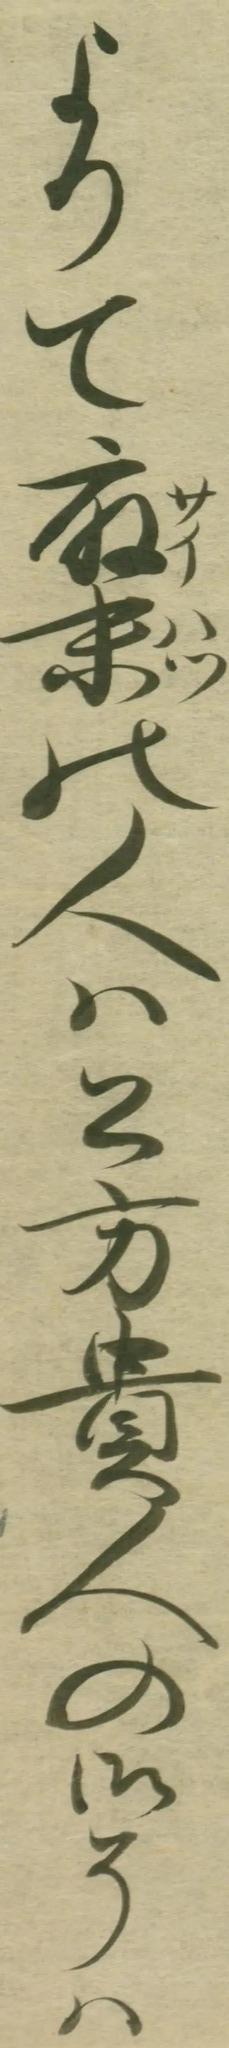よりて扇末の人は公方貴人の御そは
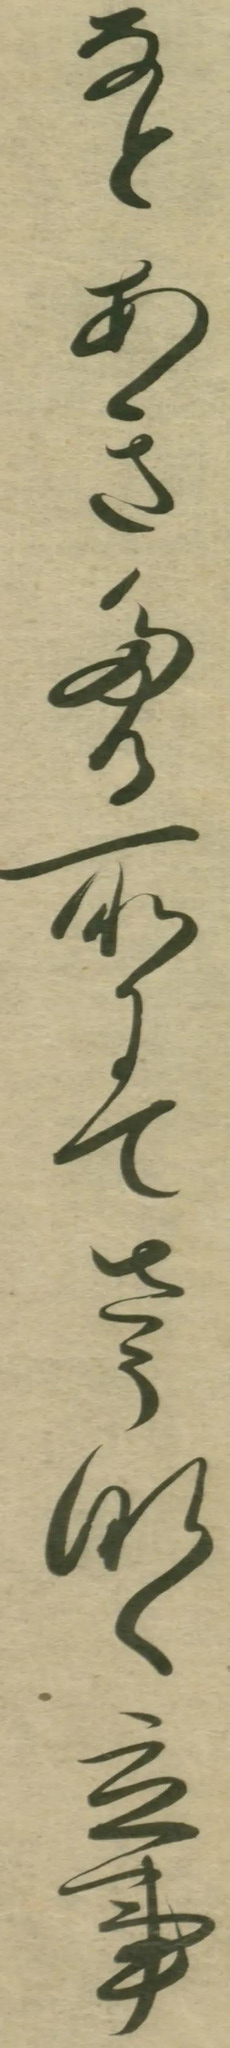なとあきたる所にてさうなく立事

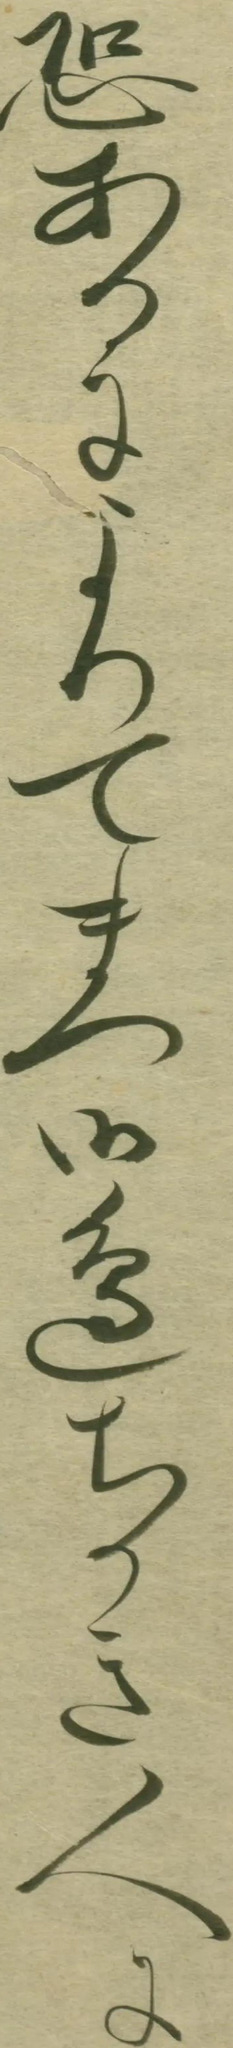恐あるによりてまつ御辺ちかき人に
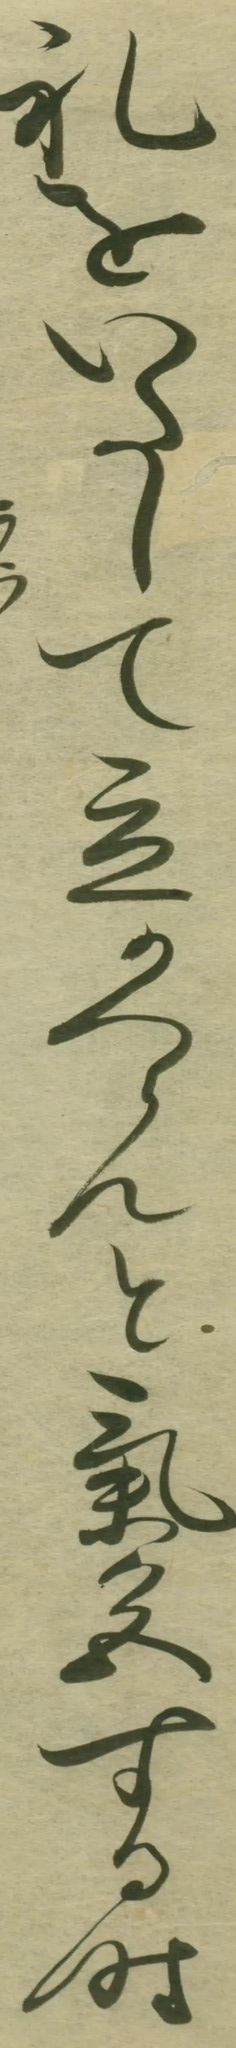礼をいたして立かへらんと気色する時
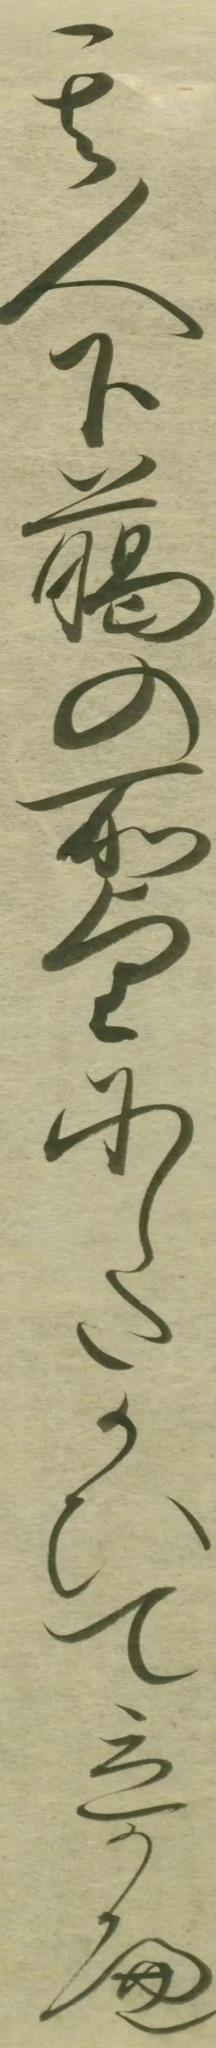其人下臈の所望にしたかひて立かへ
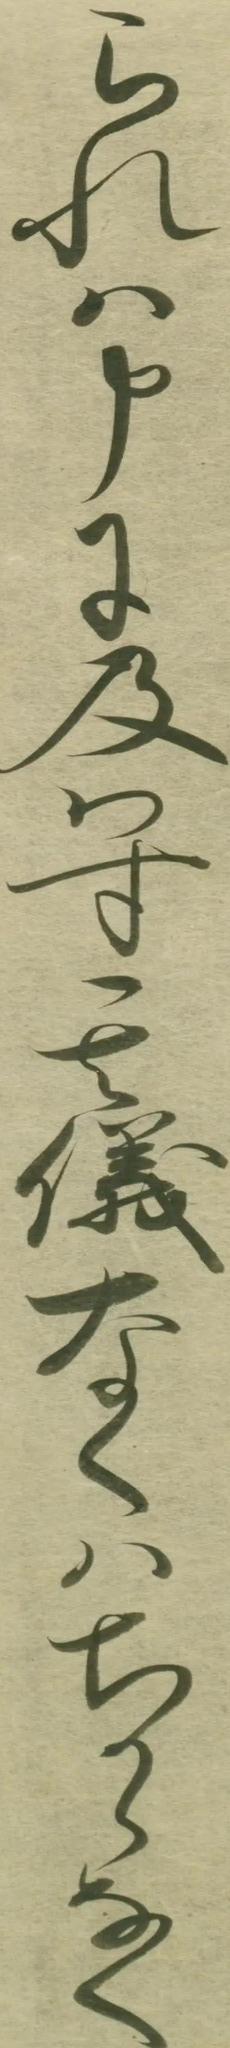られは申に及はす其儀なくはちからなく
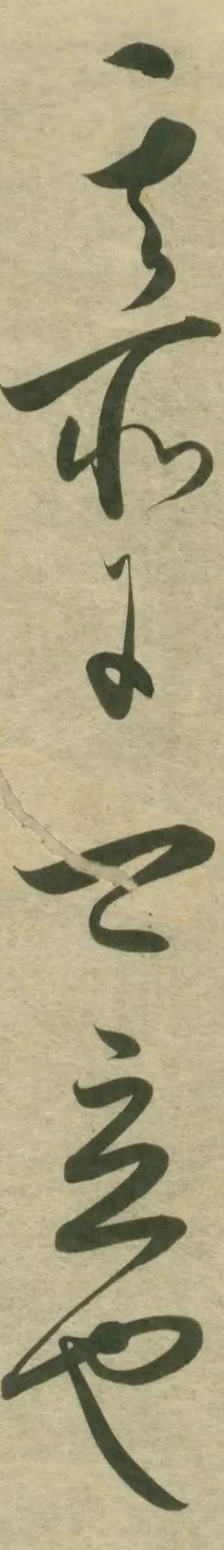其所に可立也
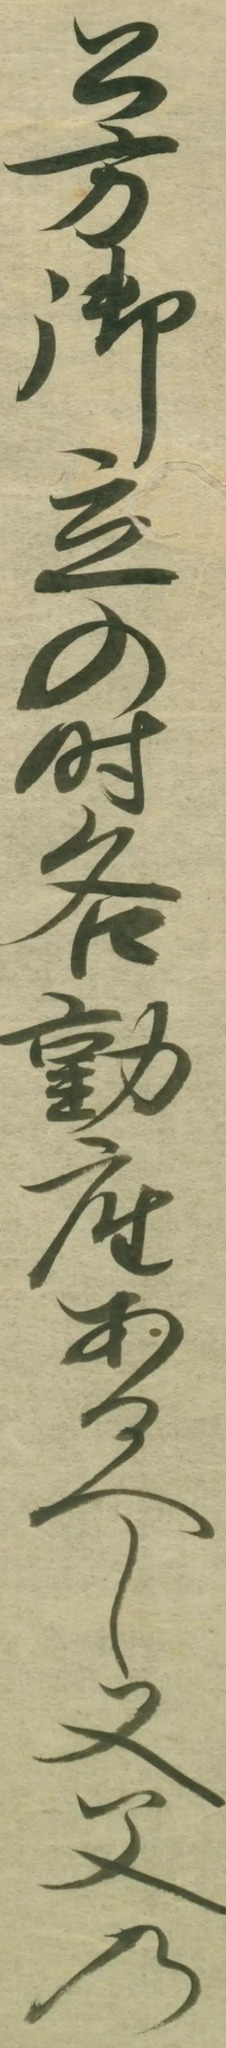公方御立の時各勤座あるへし又父の
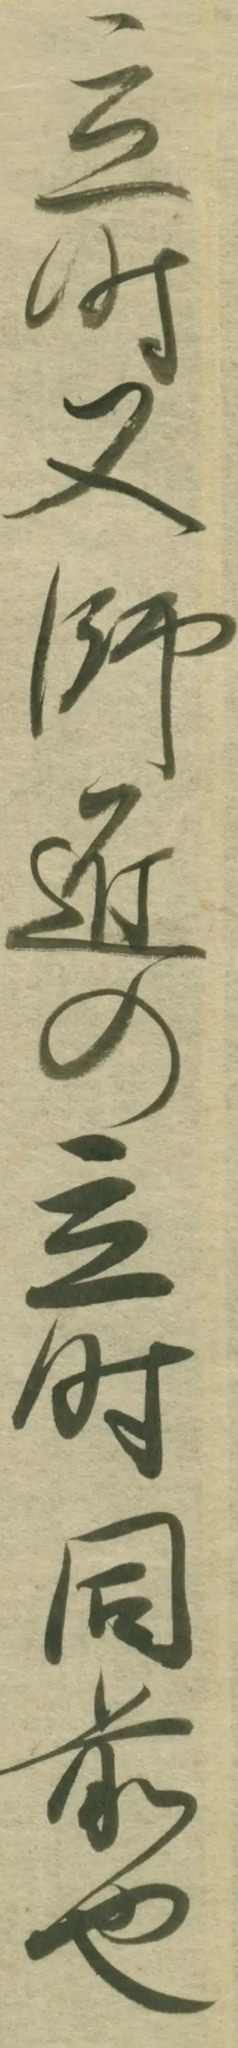立時又師匠の立時同前也
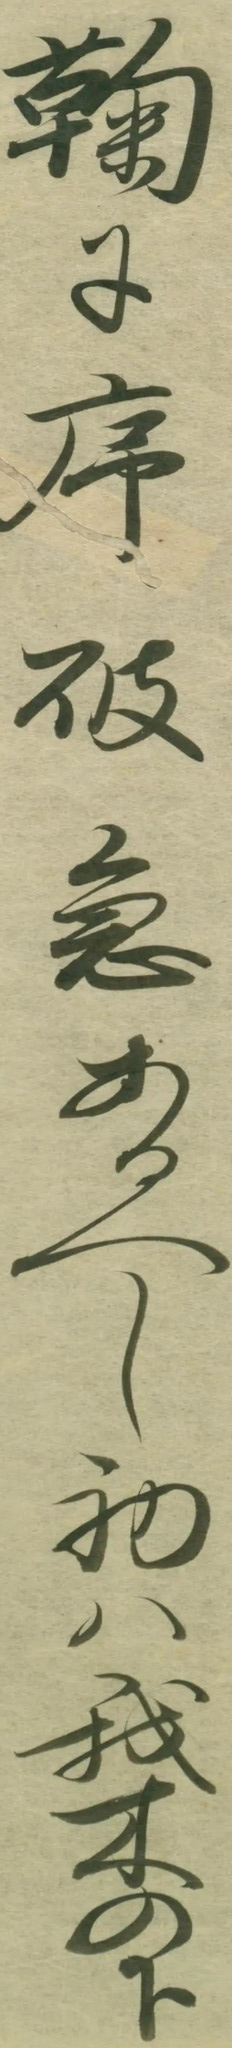鞠に序破急あるへし初は我木の下
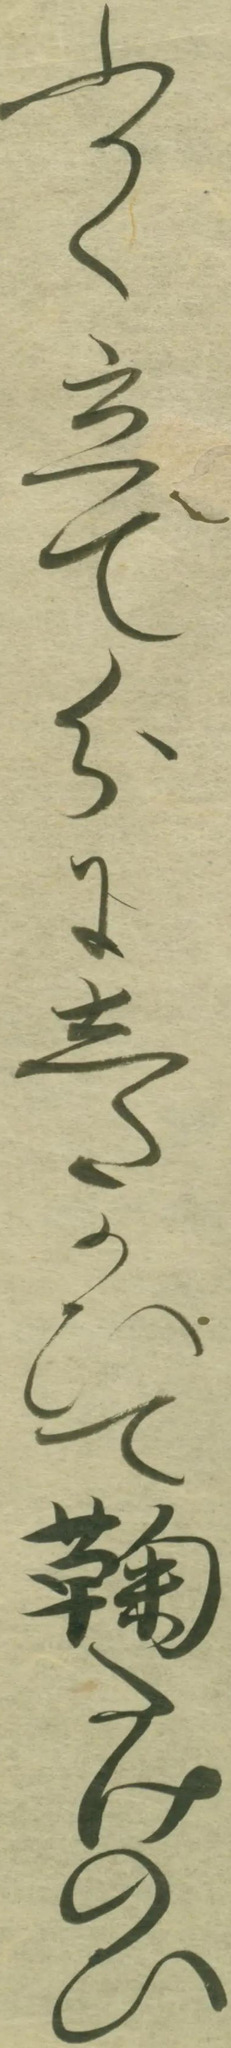ふかく立て分にしたかひて鞠たけのひ
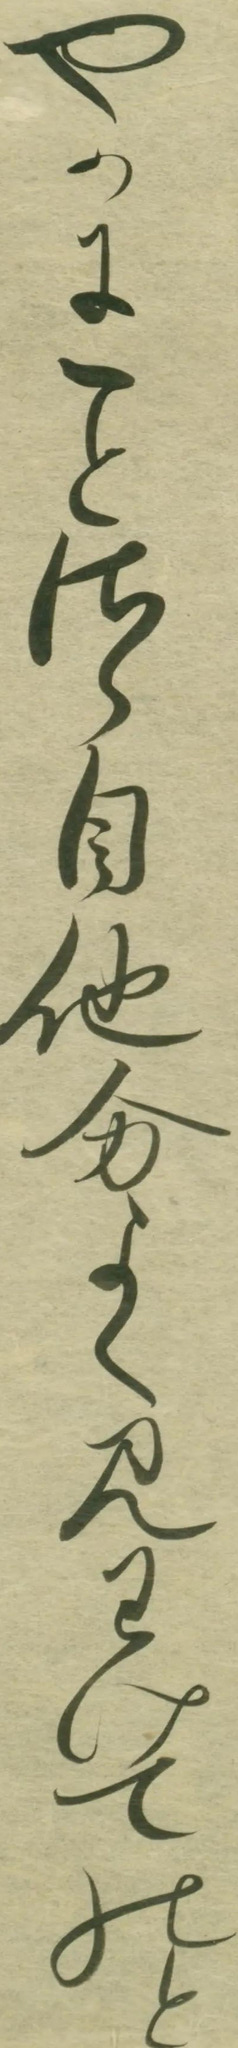やかにことさら自他分よく見わけてのと
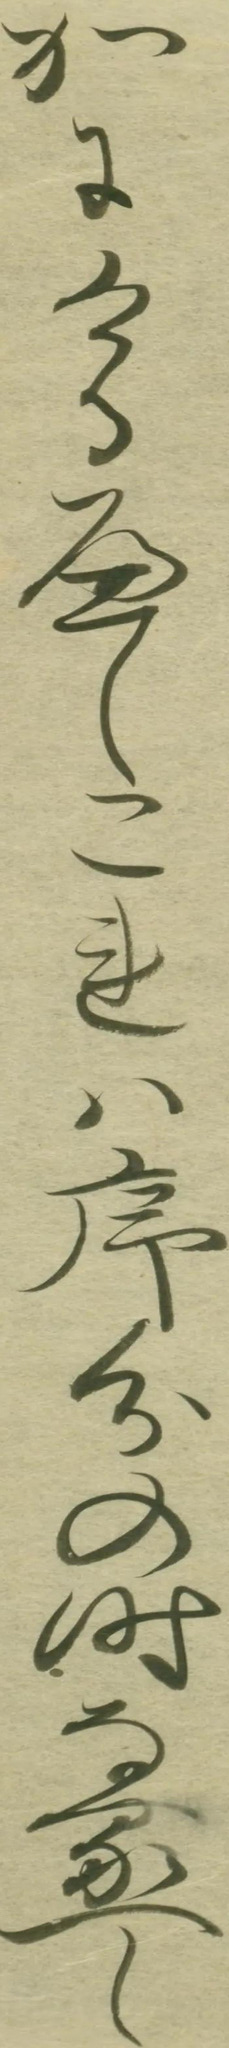かにけるへしこれは序分の時なるへし
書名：蹴鞠之条々大概
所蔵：国立国会図書館 National Diet Library, JAPAN
